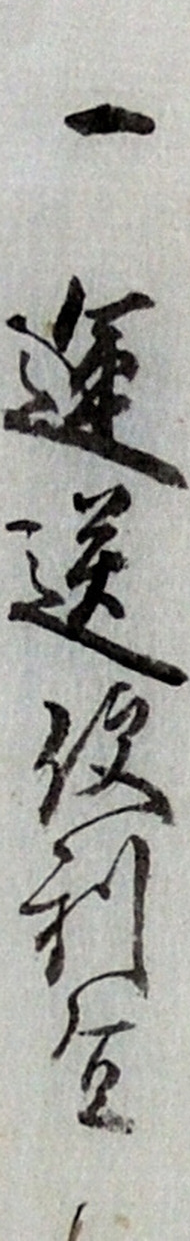一運送便利宜
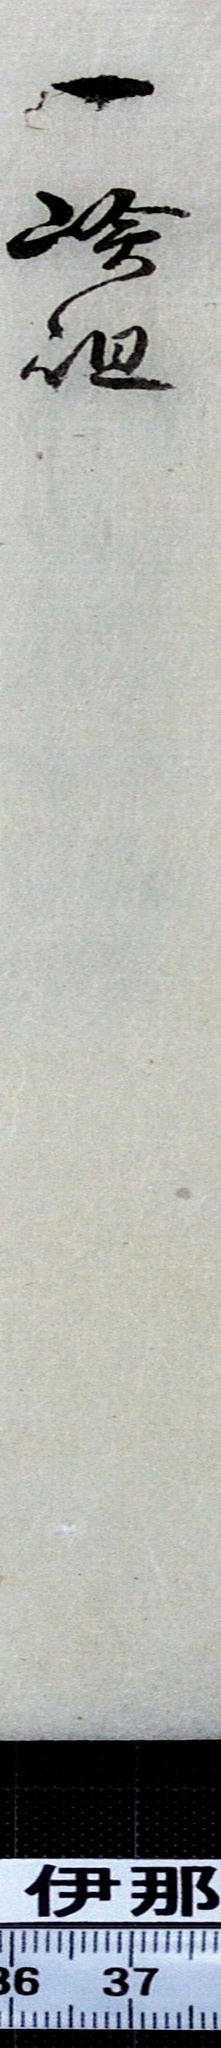一嶮岨
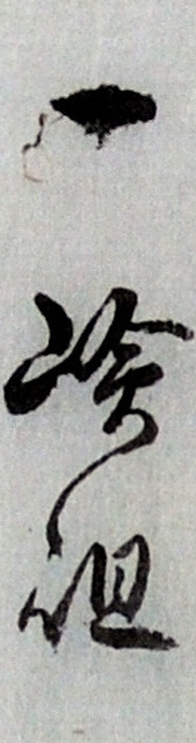一嶮岨

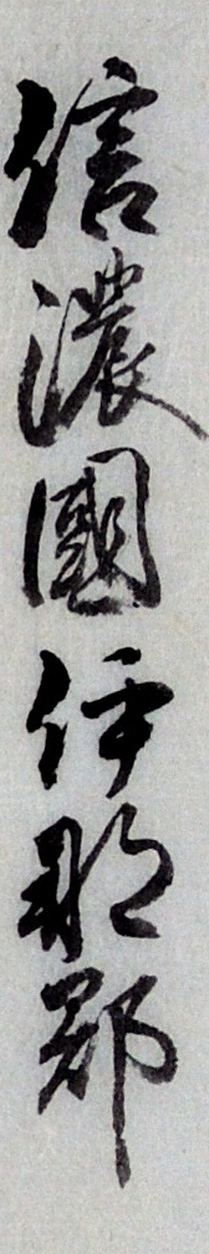信濃国伊那郡
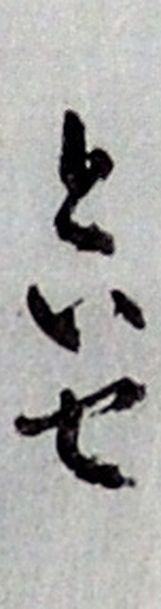といせ
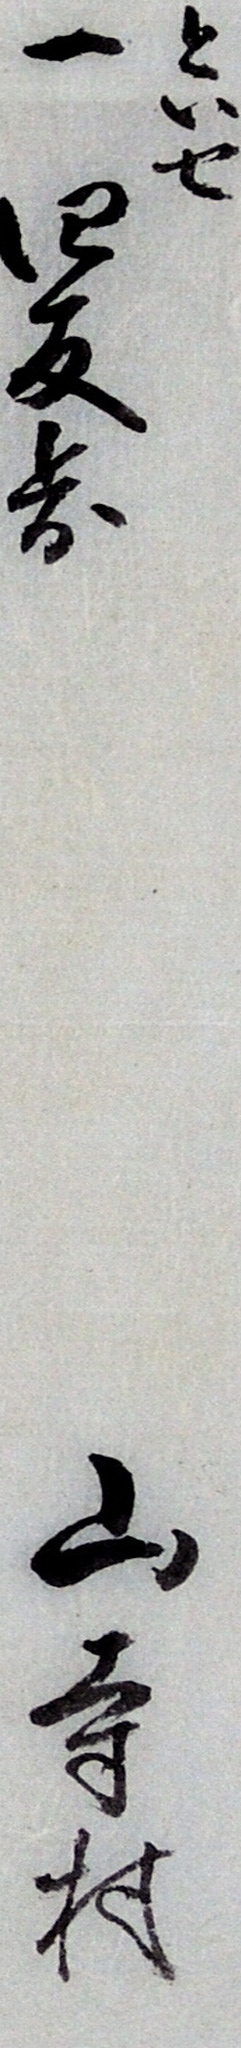一四反歩山寺村
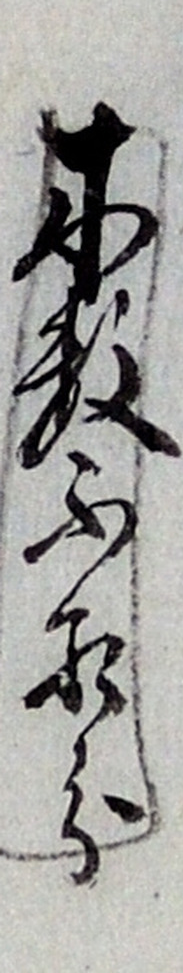木数不相分
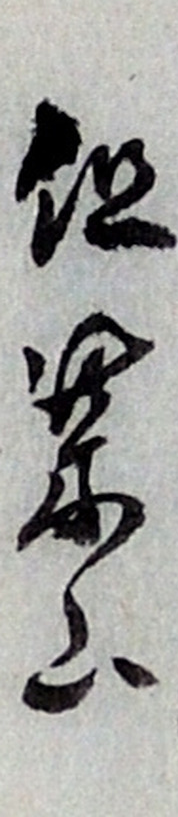但柴山
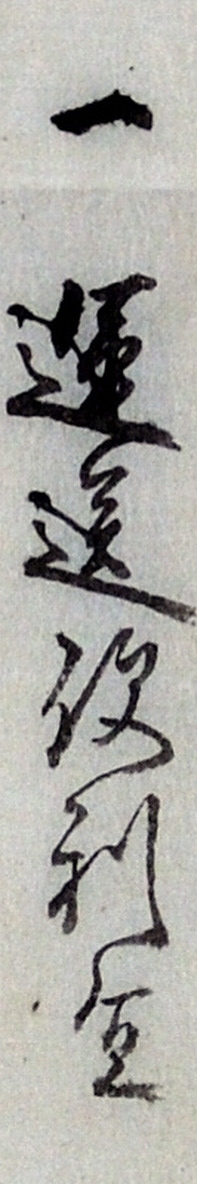一運送便利宜
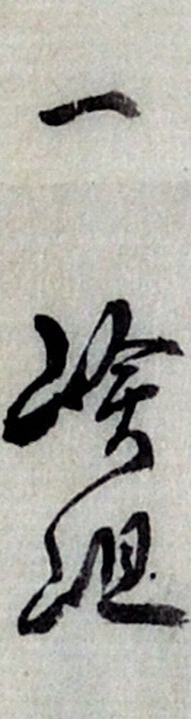一嶮岨
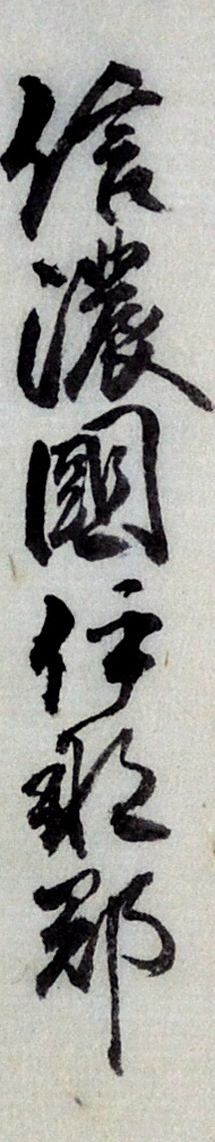信濃国伊那郡
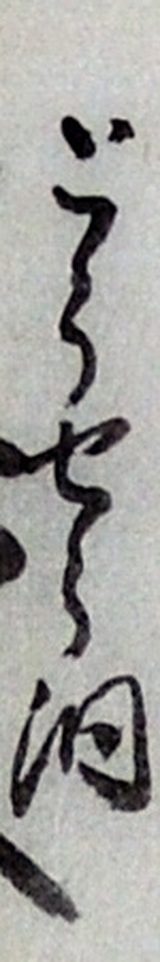ごうせう洞
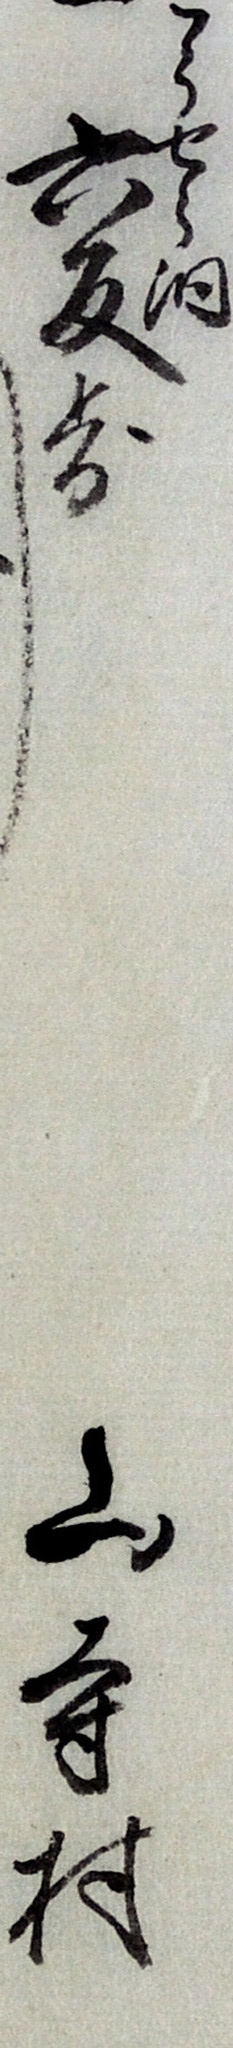一六反歩山寺村
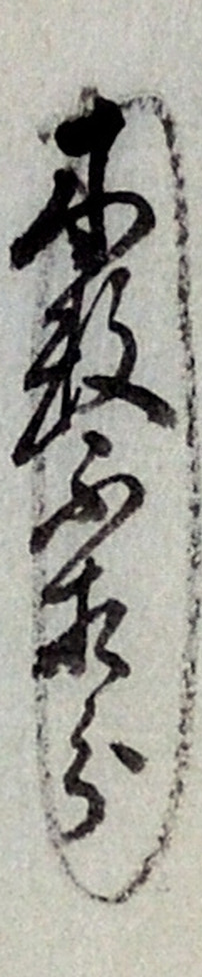木数不相分
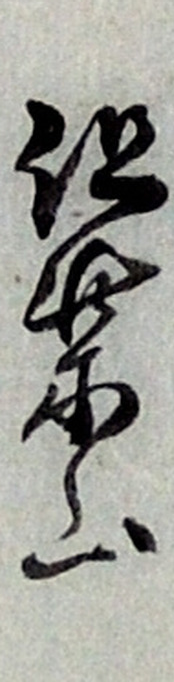但柴山
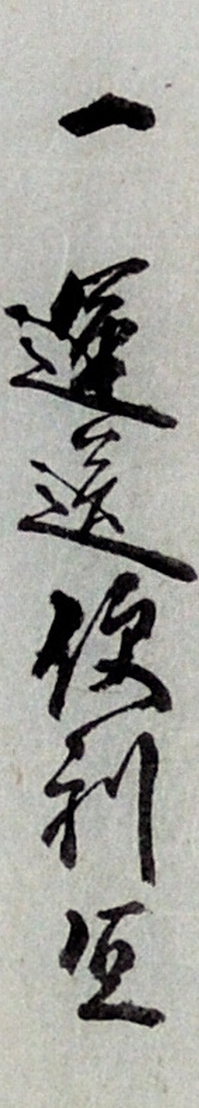一運送便利宜
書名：官林反別帳
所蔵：伊那市立高遠町図書館・合同会社AMANE
